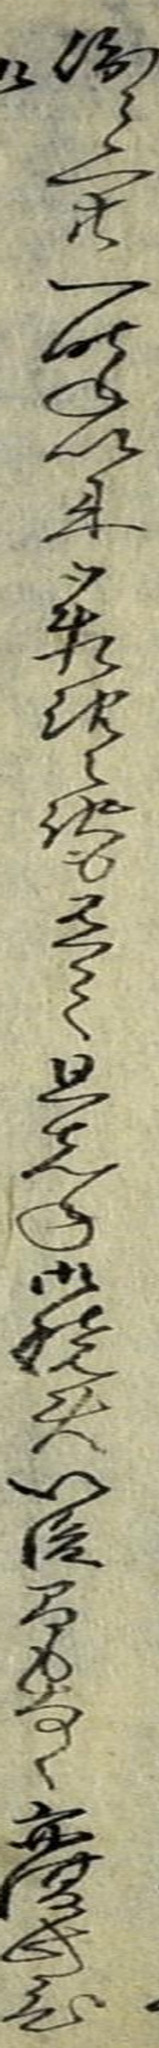儀に候へ共一昨年以来御頼銀之訳も有之且先年御焼失以後間もなく亦復此度
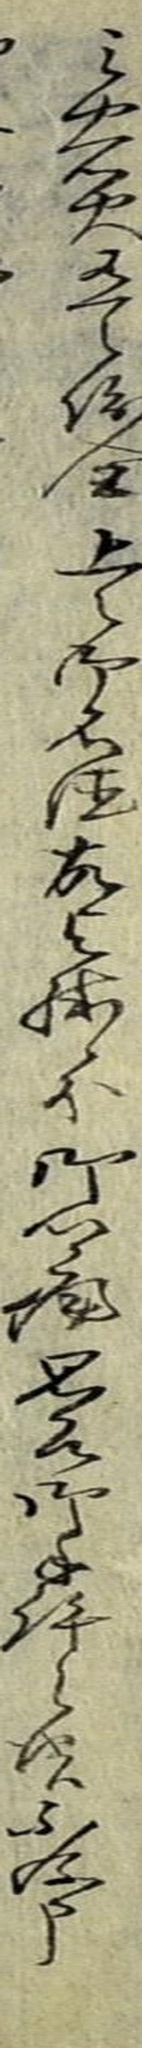之御火災有之儀全上之御不徳故と殊之外御心痛思召御手許之儀は不及申
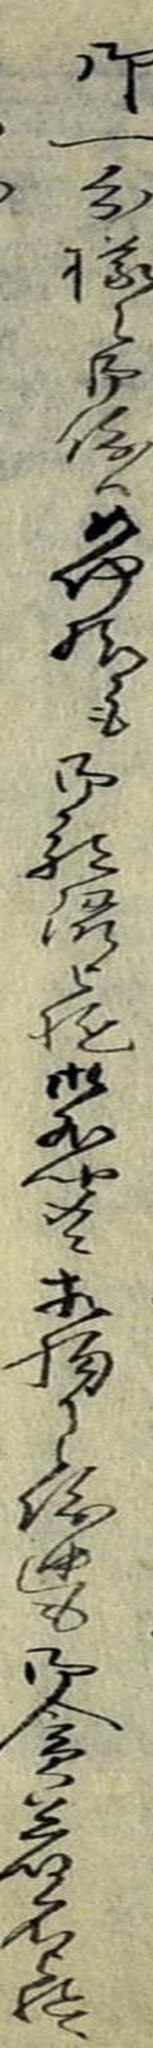御一分様之御儀は如何様にも御難渋被遊御外聞に相拘り候儀迚も御貪着不被遊候
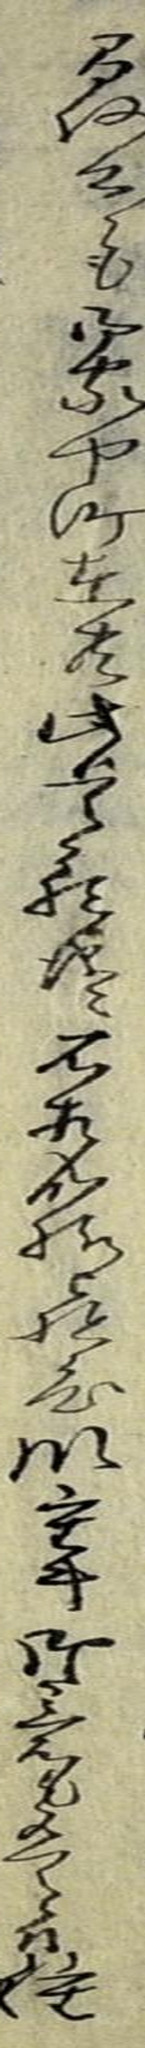間何分にも御家中町在共此上之難儀に不相成様被遊度段重キ御意も有之に付種
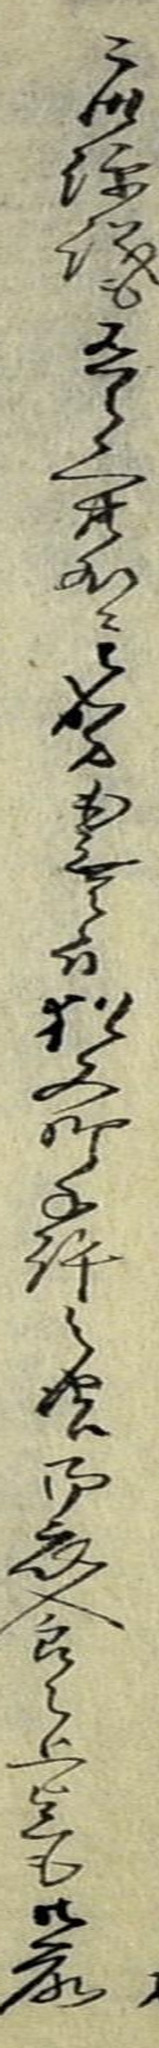々御評議も有之候へ共外に被成方も無之に付猶又御手許之儀は御衣食之上迄も御厳
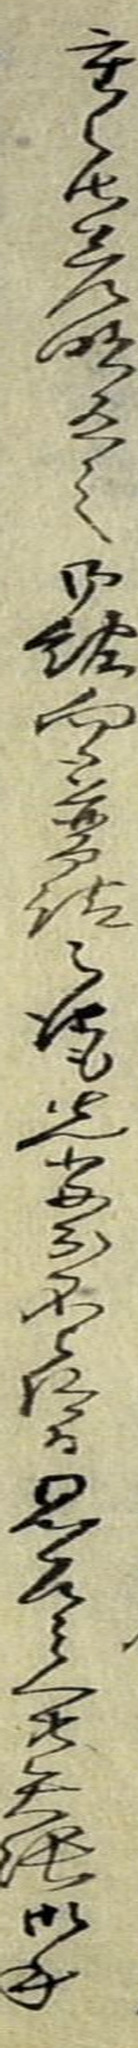重之御差略有之御館向御普請之儀も先当分不被仰付思召に候へ共矢張御手
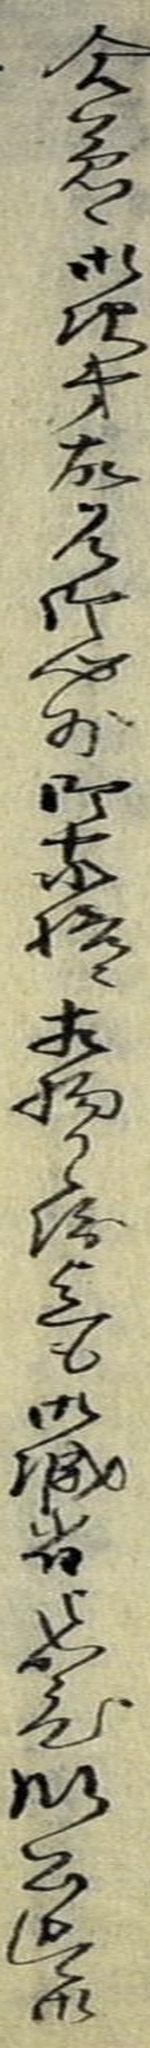合兼候御次第故乍御心外御家格に相拘り候儀迄も御減省被成度段公辺へ御
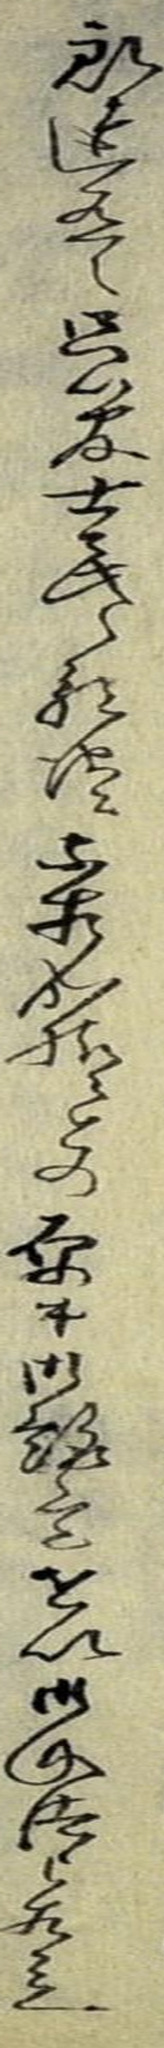願達有之只管士民之難儀に不相成様にとの厚キ御趣意を以御趣法被相立
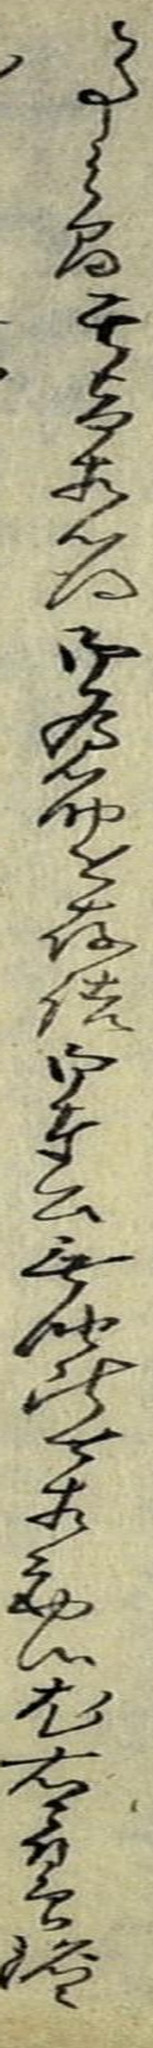候事に候間其旨相心得御為筋を存詰御奉公無由断可相勤候尤右に付而は銘々
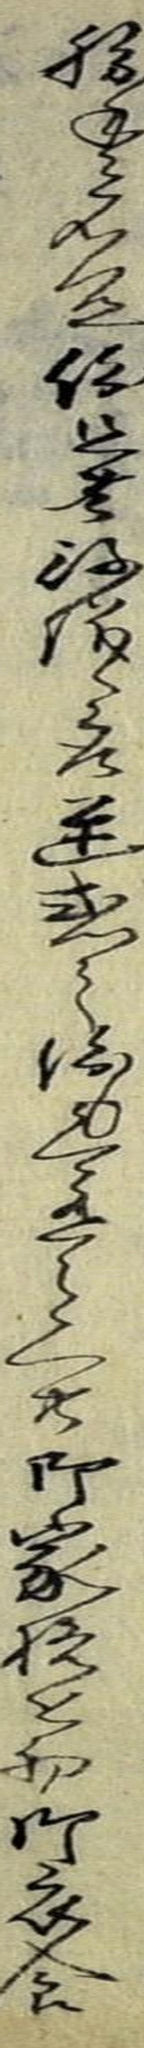勝手方不宜儀且は役儀へ取迷惑之儀も可有之候へ共御家格を初御衣食
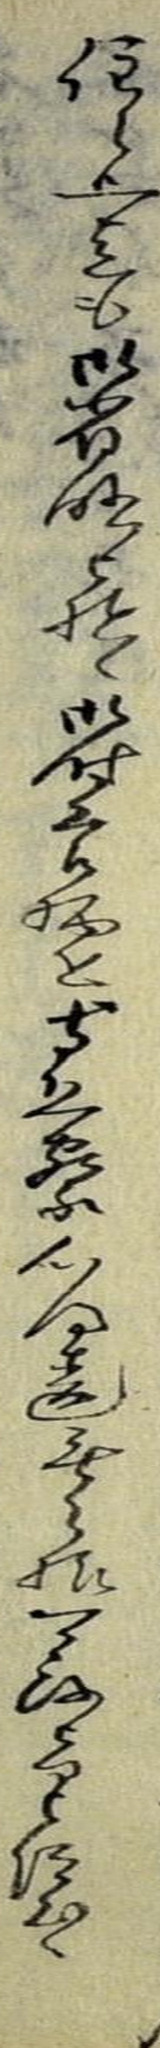住之上迄も御省略被遊候御時節柄を奉上察心得違無之様可致旨被仰出候
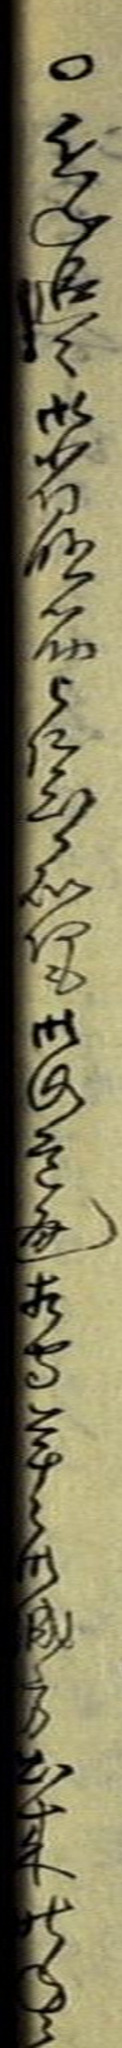○近年追々御省略筋被仰出候処何も御趣意通相守年々御減方出来昨年に至候而は
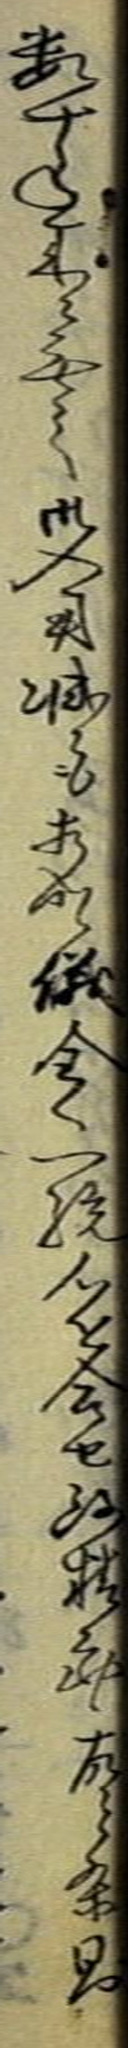数十年来に無之御入用減にも相成候儀全く一統心を合せ致精勤故之候条即
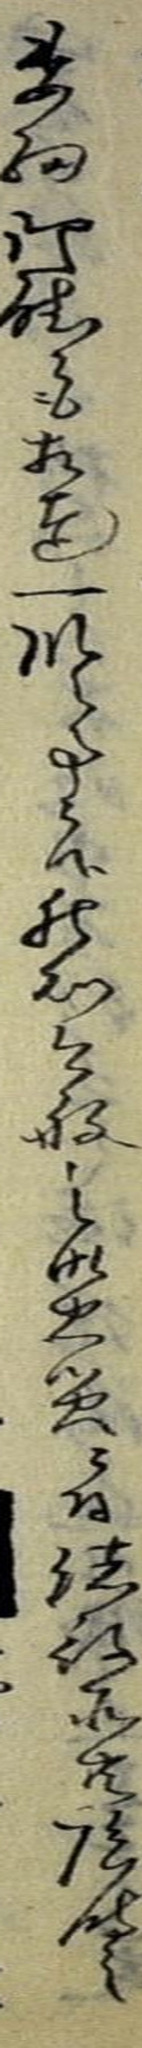委細御聴にも相達一段之事に候然処今般之御火災に付諸役所共臨時之
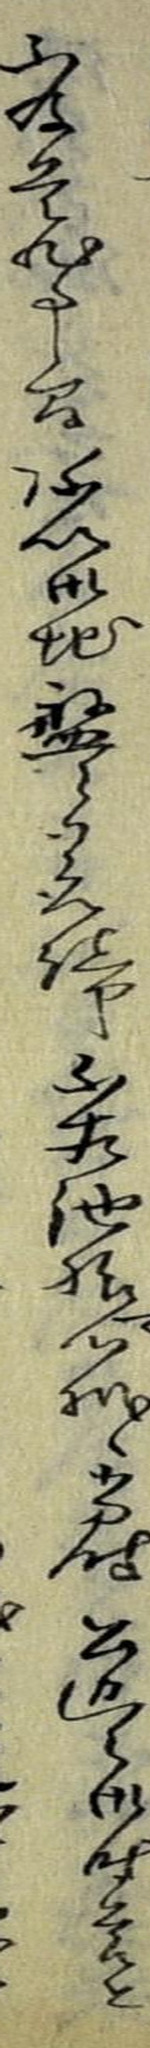不及是非事之間弥以御地盤之御取締不相弛様可心掛候当時公辺へ御時節と
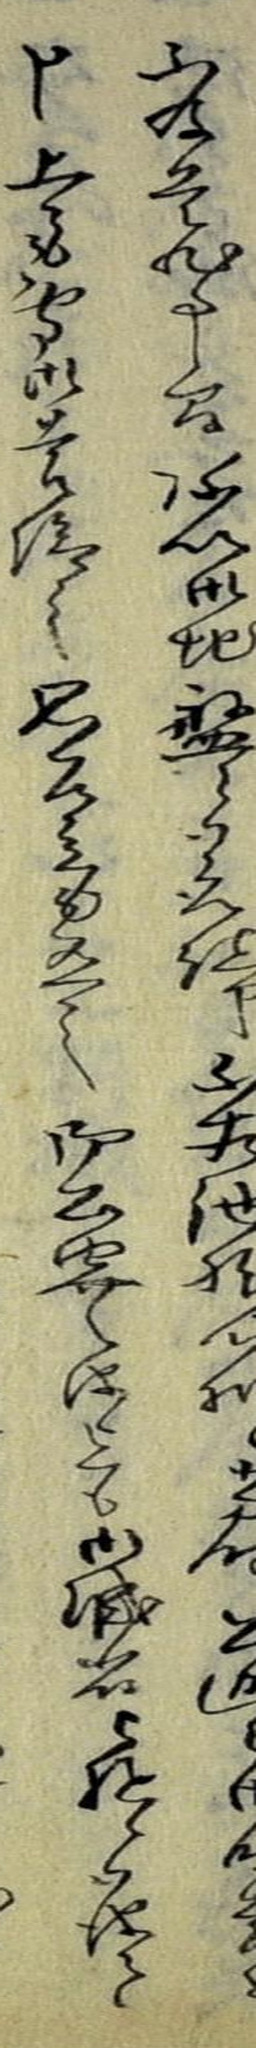申上候も専御節倹之思召立も有之御公界之儀迄も御減省被遊候御儀に候
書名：命令之部 六
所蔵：福井県文書館 Fukui Prefectural Archives
